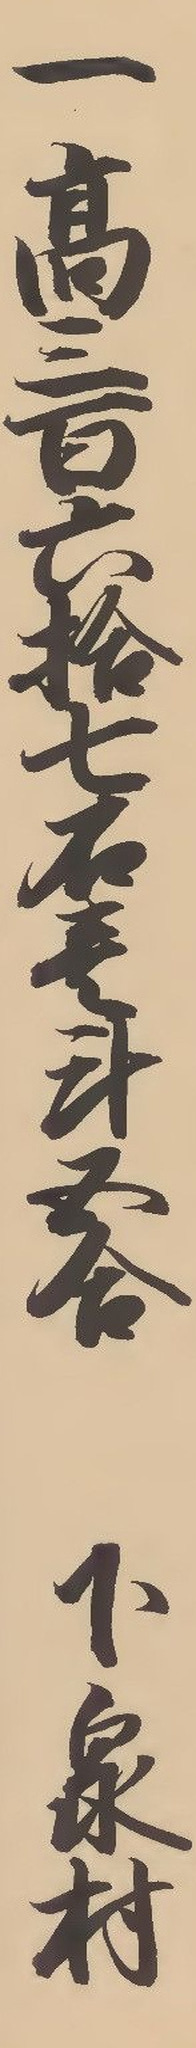一高三百六拾七石壱斗五合下泉村
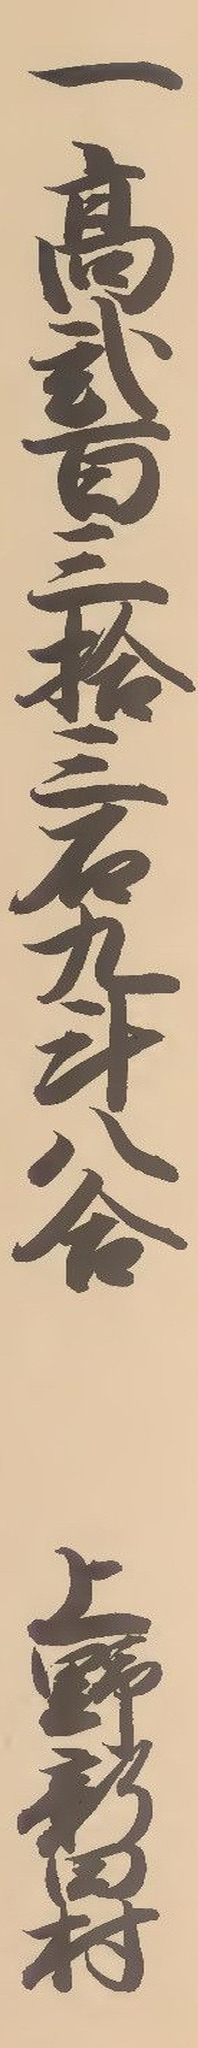一高弐百三拾三石九斗八合上野新田村
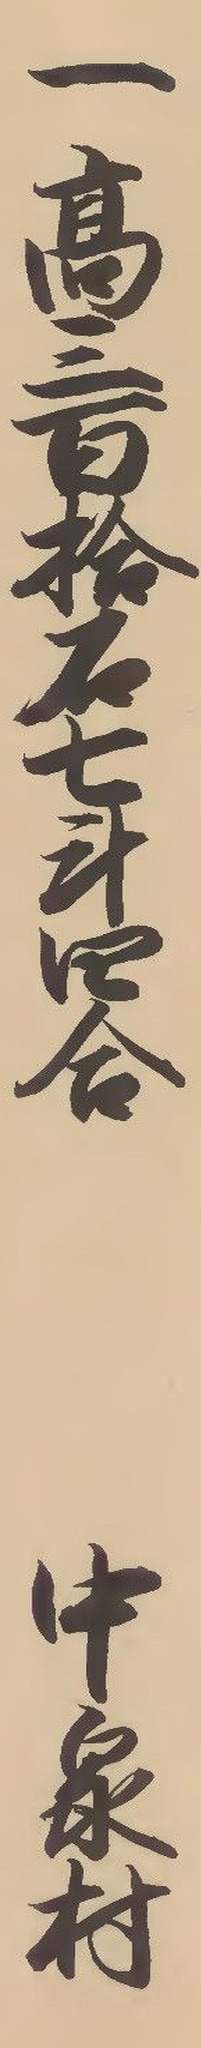一高三百拾石七斗四合中泉村
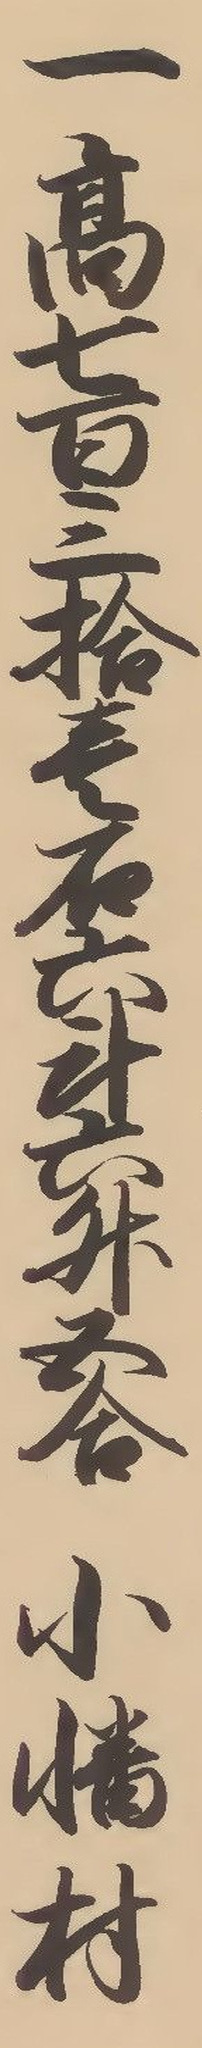一高七百三拾壱石六斗六升五合小幡村
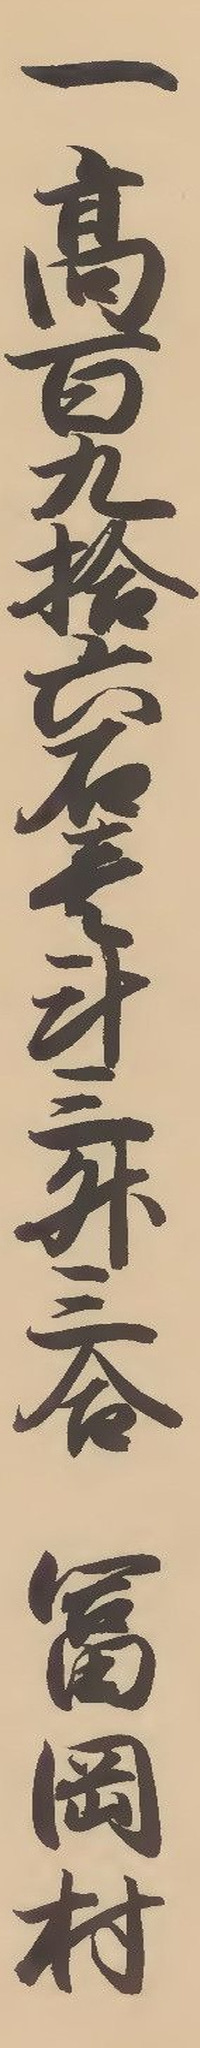一高百九拾六石壱斗三升三合冨岡村

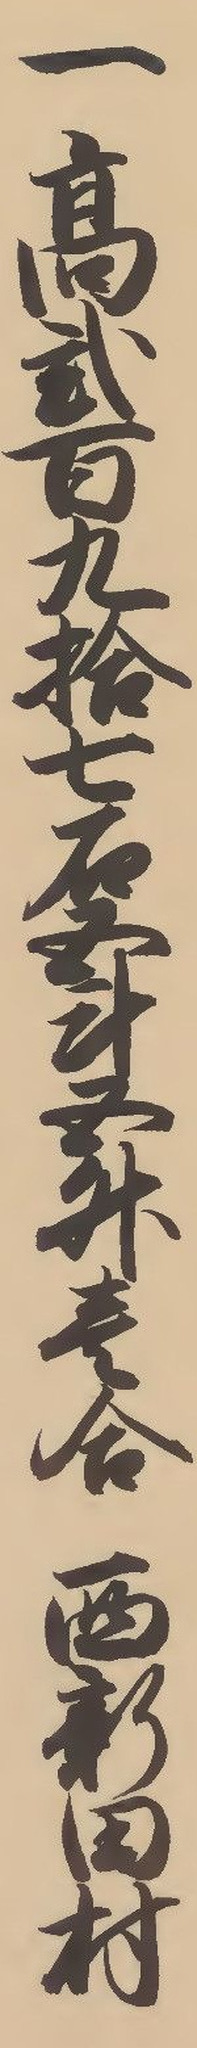一高弐百九拾七石五斗五升壱合西新田村
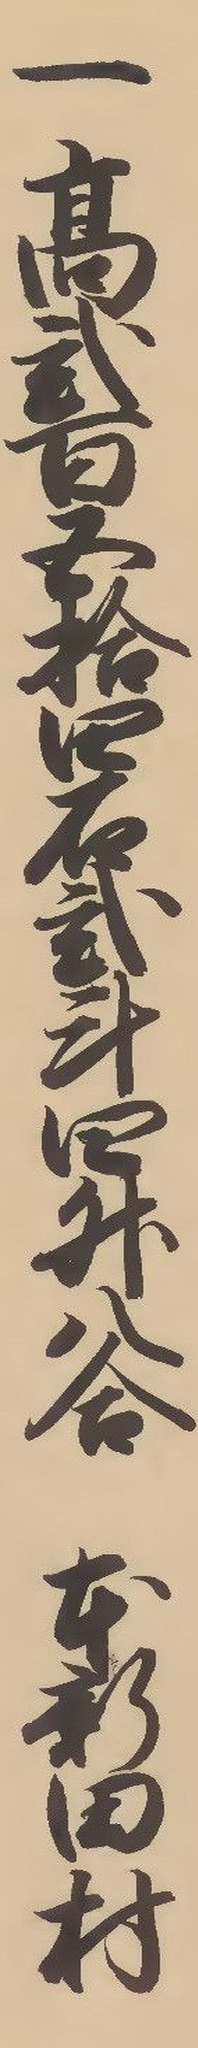一高弐百五拾四石弐斗四升八合本新田村
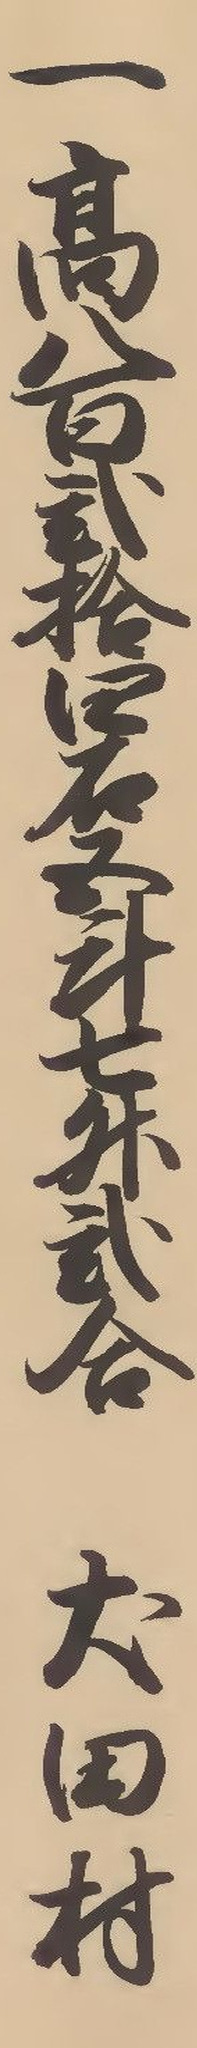一高八百弐拾四石五斗七升弐合犬田村
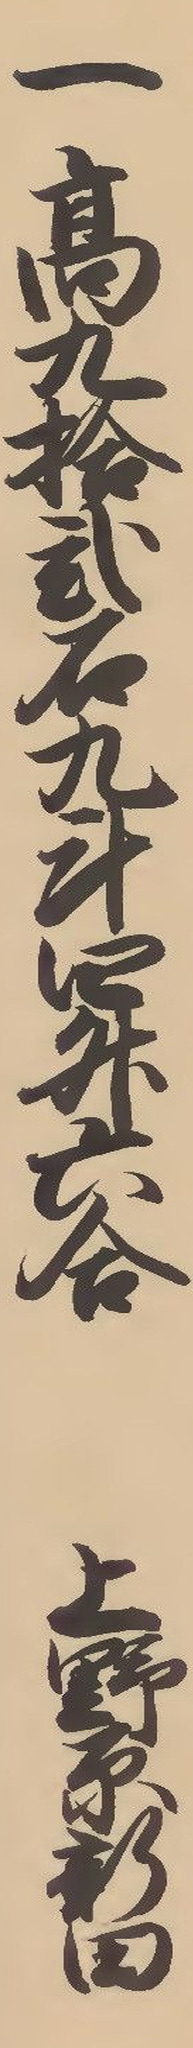一高九拾弐石九斗四升六合上野原新田
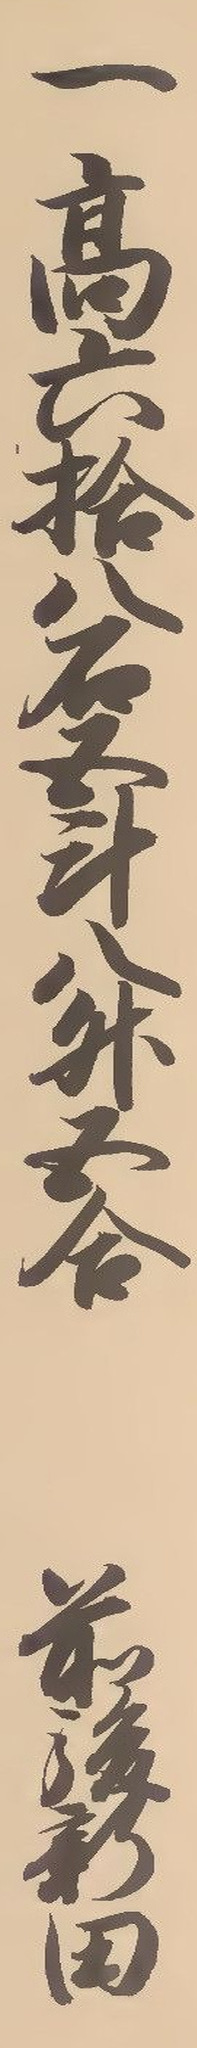一高六拾八石五斗八升五合前後新田
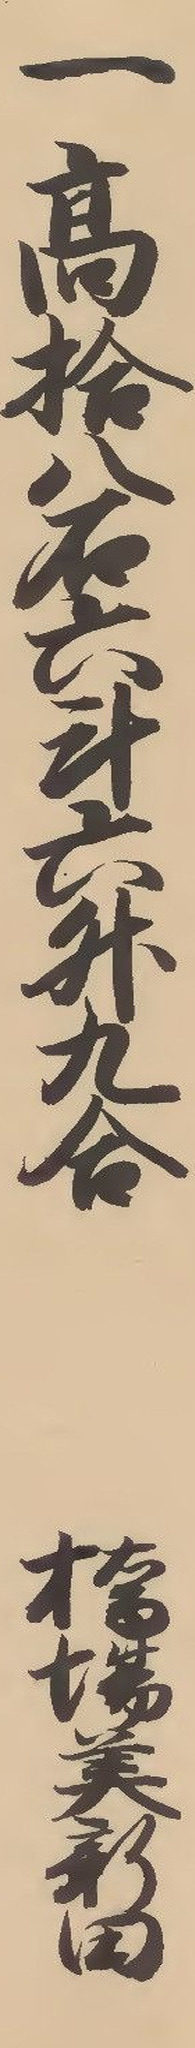一高拾八石六斗六升九合橋場美新田
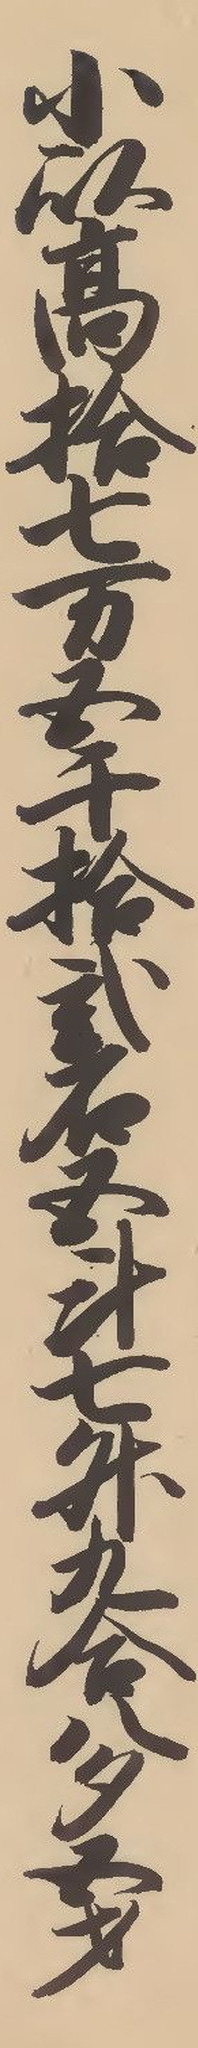小以高拾七万五千拾弐石五斗七升九合八勺五才

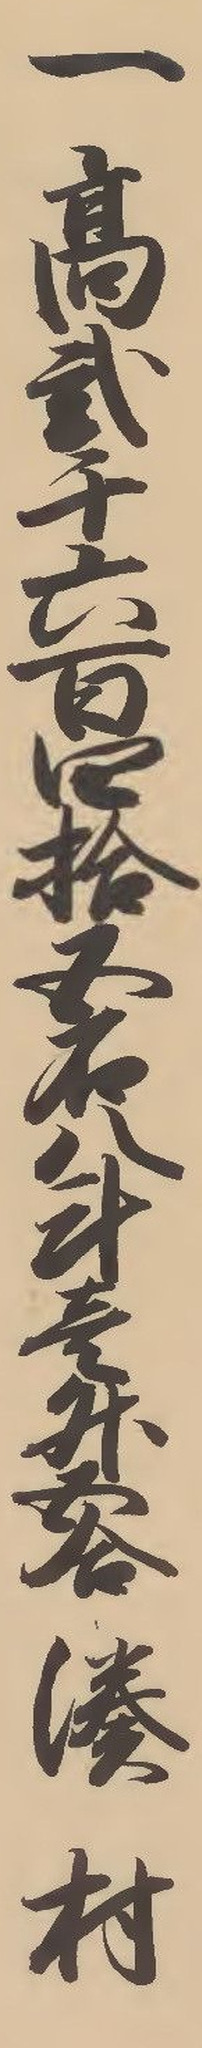一高弐千六百四拾五石八斗壱升五合湊村
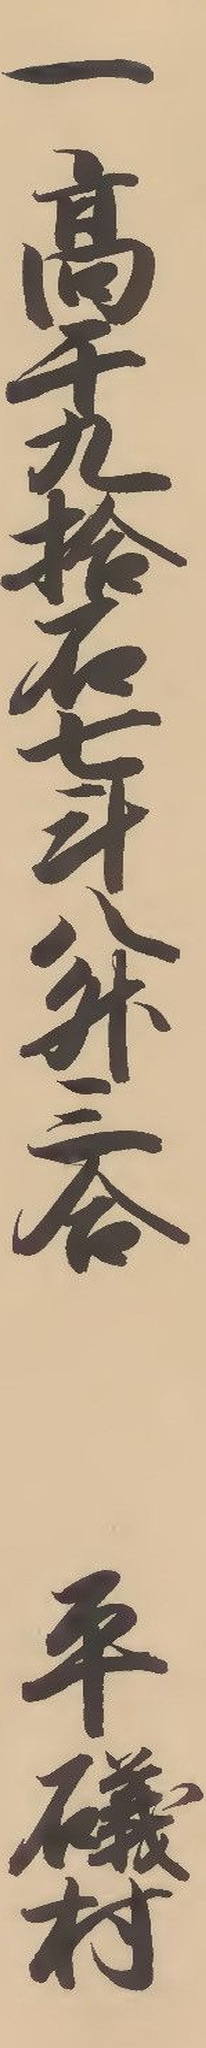一高千九拾石七斗八外三合平磯村
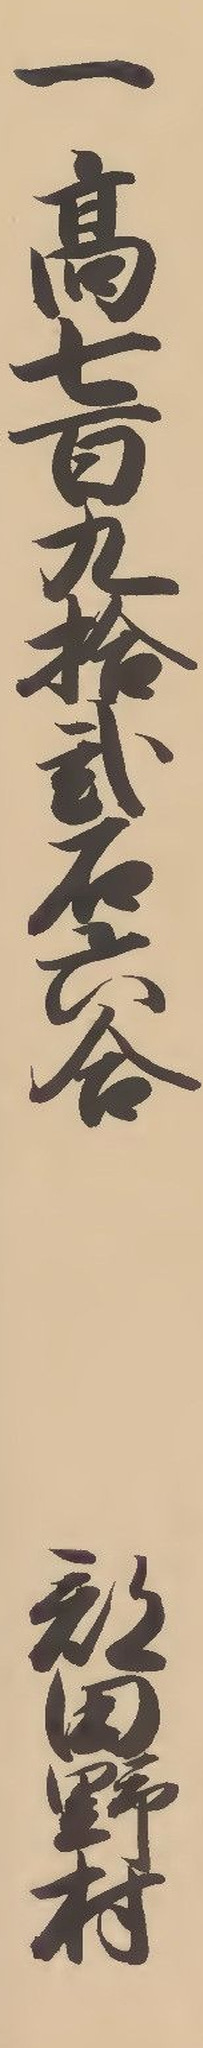一高七百九拾弐石六合部田野村
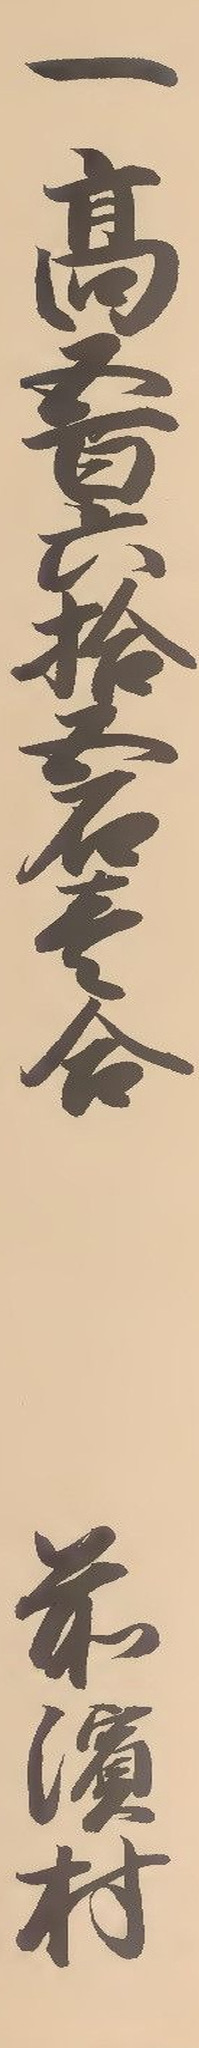一高五百六拾五石壱合前浜村
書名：常陸国郷帳
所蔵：国立公文書館 National Archives of Japan
